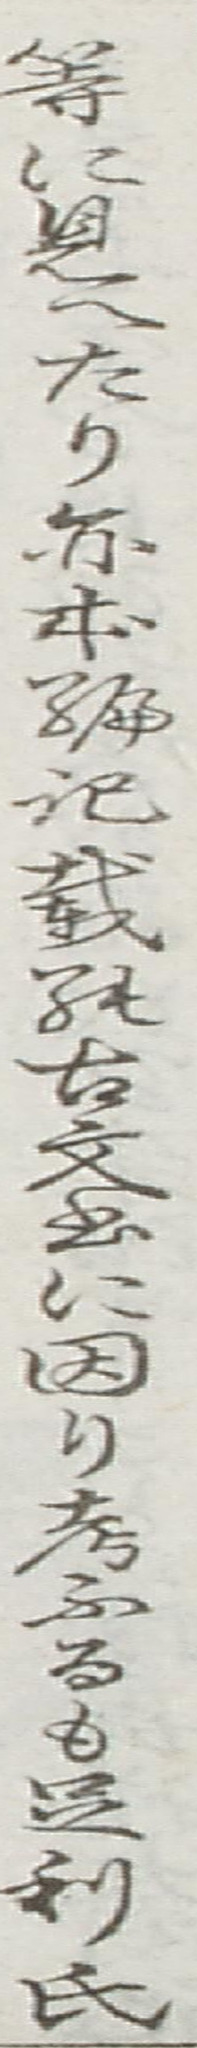等に見へたり亦本編記載の古文書に因り考ふるも足利氏
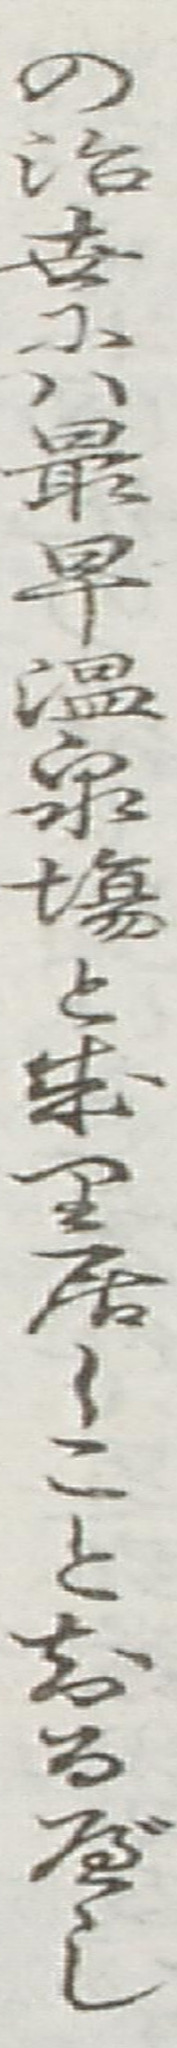の治世には最早温泉場と成居しことなるべし
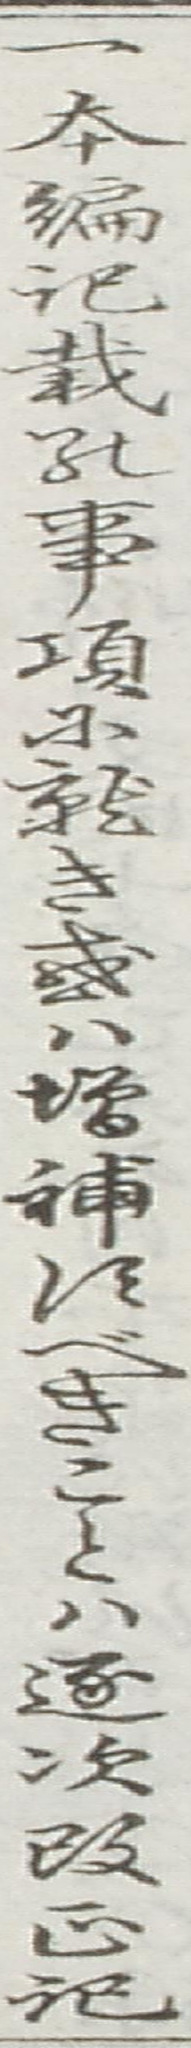一本編記載の事項に就き或遺は増補すべきことは逐次改正記
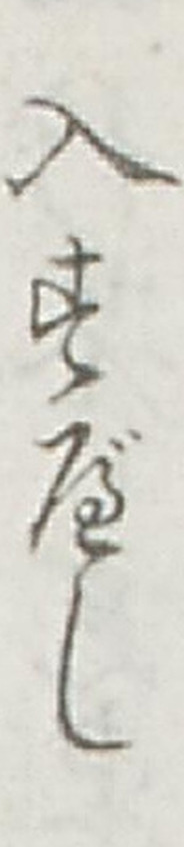入すべし
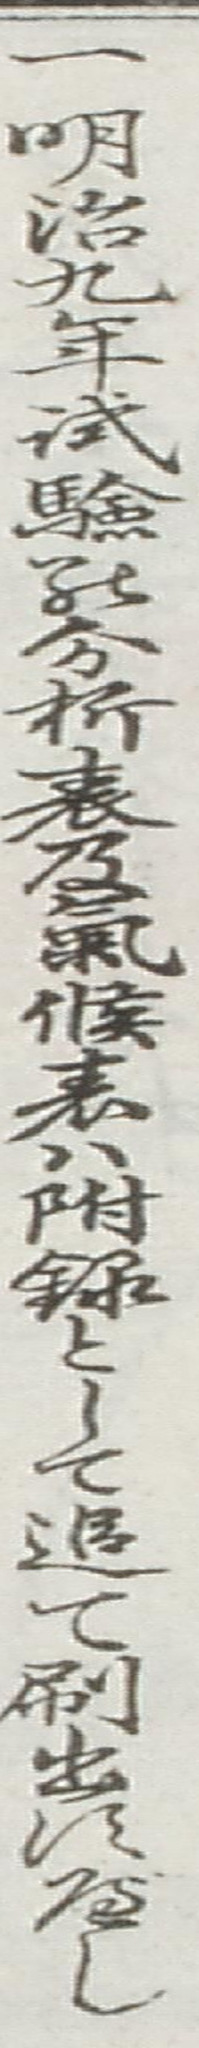一明治九年試験の分析表及気候表は附録として追て刷出すべし
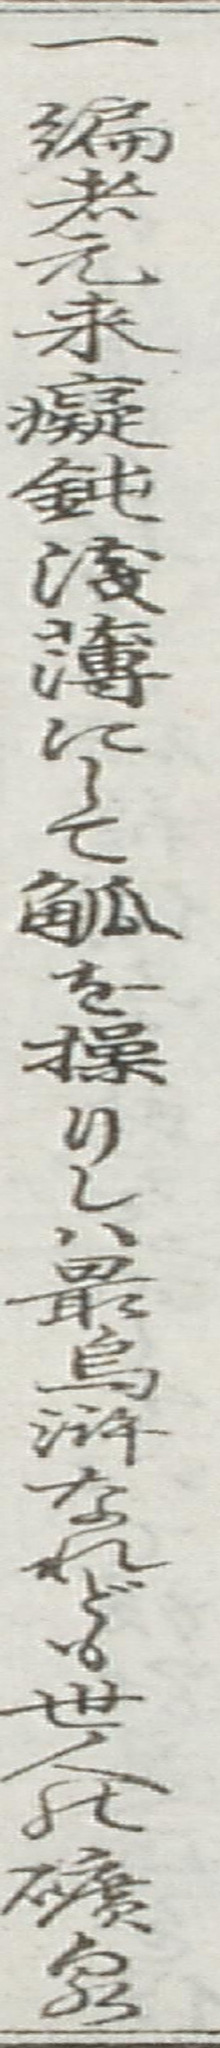一編者元来癡鈍浅薄にして觚を繰りしは最烏滸なれども世人の礦泉
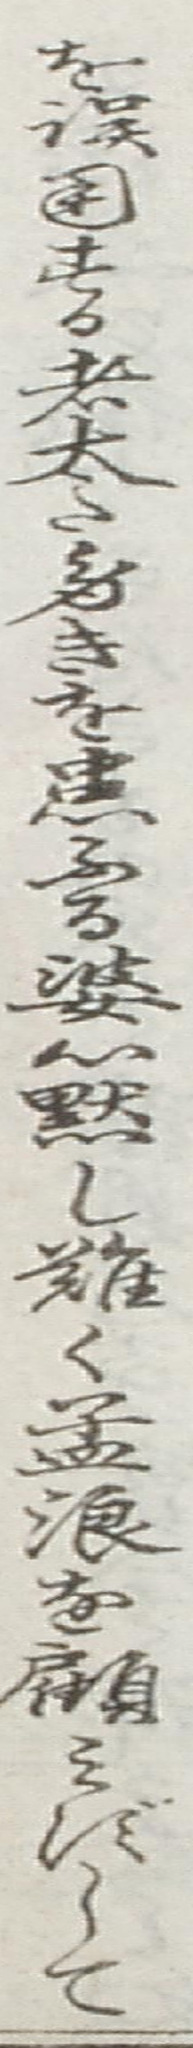を誤困する者太た多きを患ふる婆心黙し難く孟浪を顧みずして
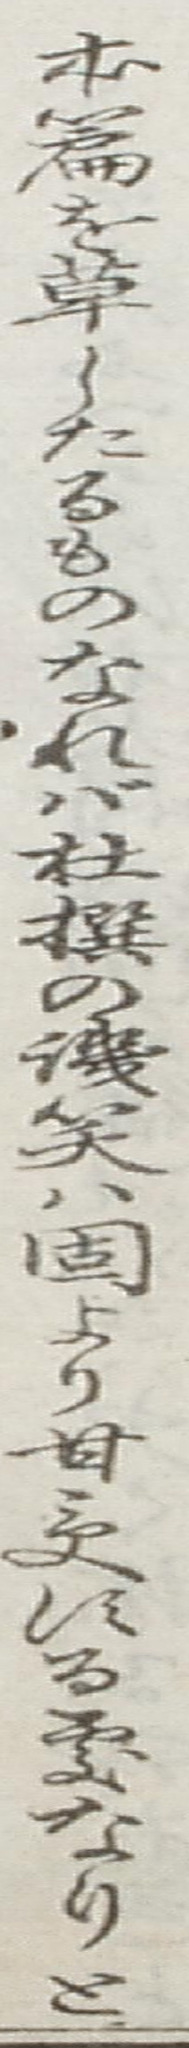本編を草したるものなれば杜撰の譏笑は固より甘受する処なりと
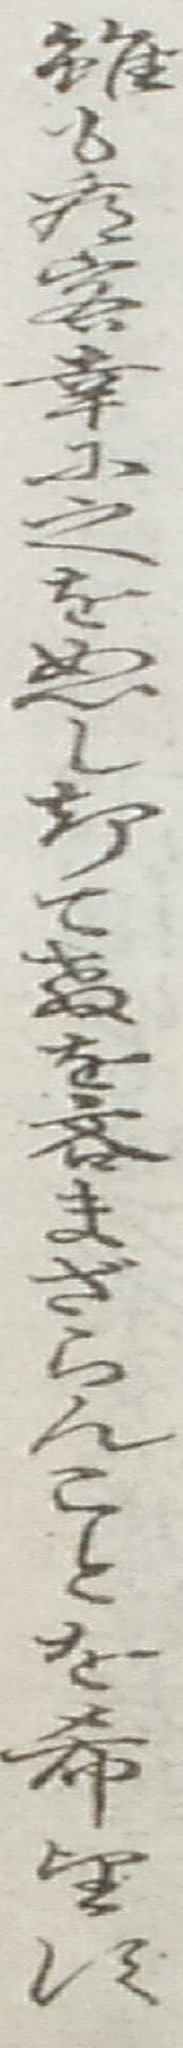雖も病客幸に之を恕し却て教を吝まざらんことを希望す
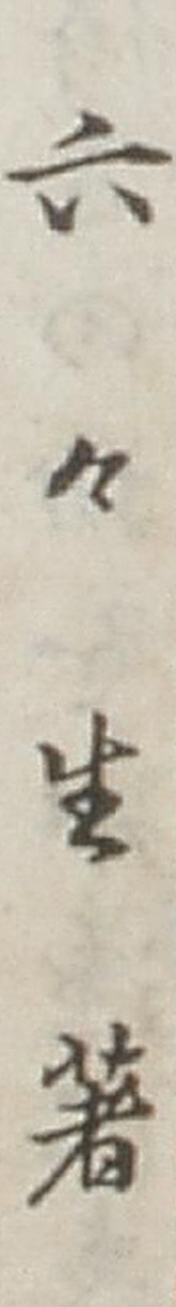六々生著
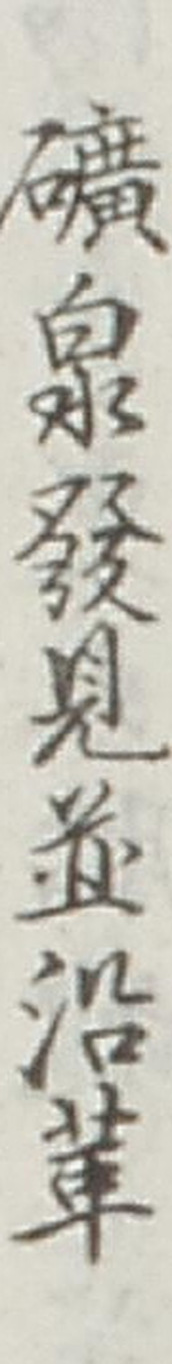礦泉発見並沿革
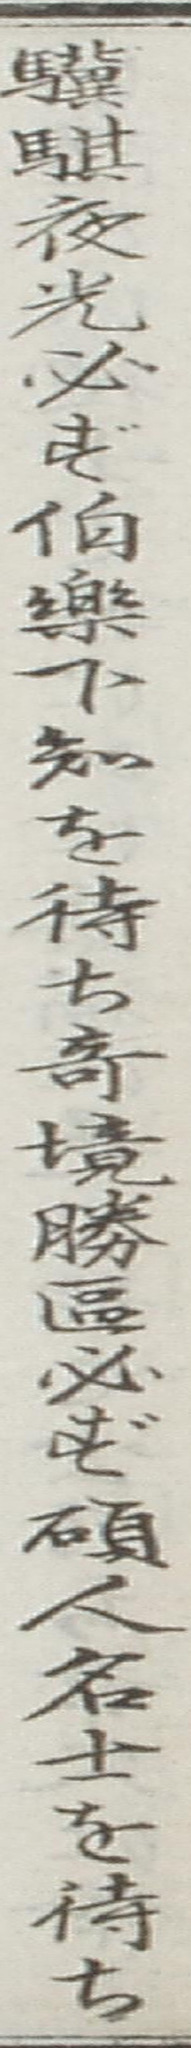騏驥夜光必ず伯楽下知を待ち奇境勝区必ず碩人名士を待ち
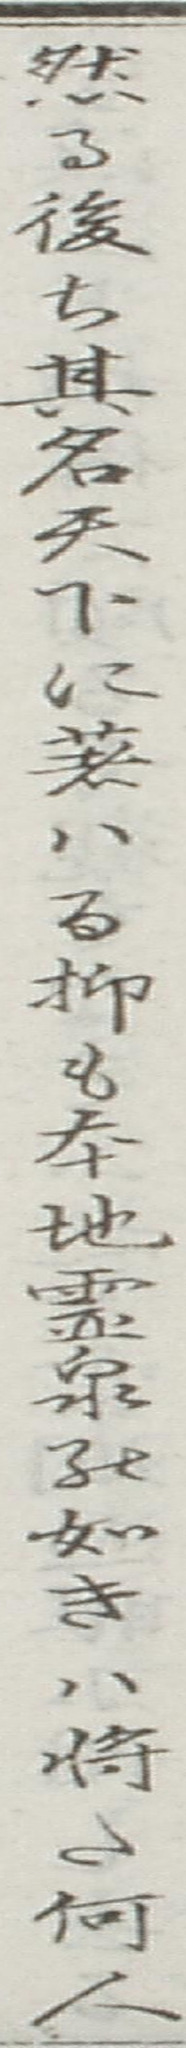然る後ち其名天下に著わる抑も本地霊泉の如きは将に何人
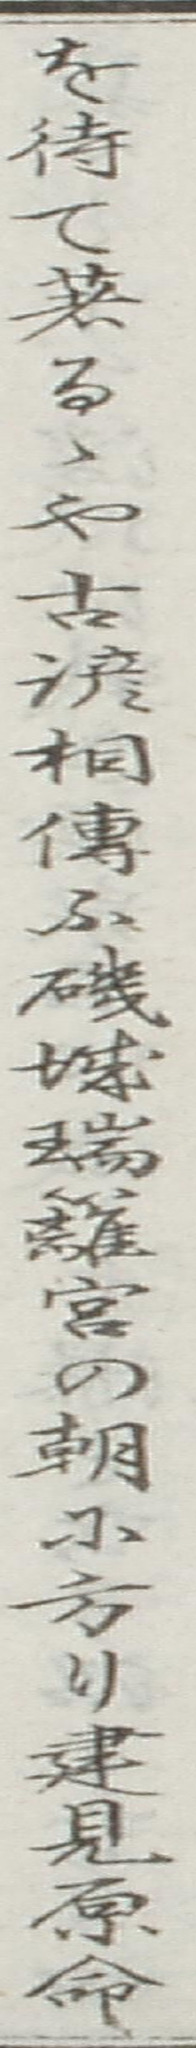を待て著るゝや古諺相傳ふ磯城瑞籬宮の朝に方り建見原命
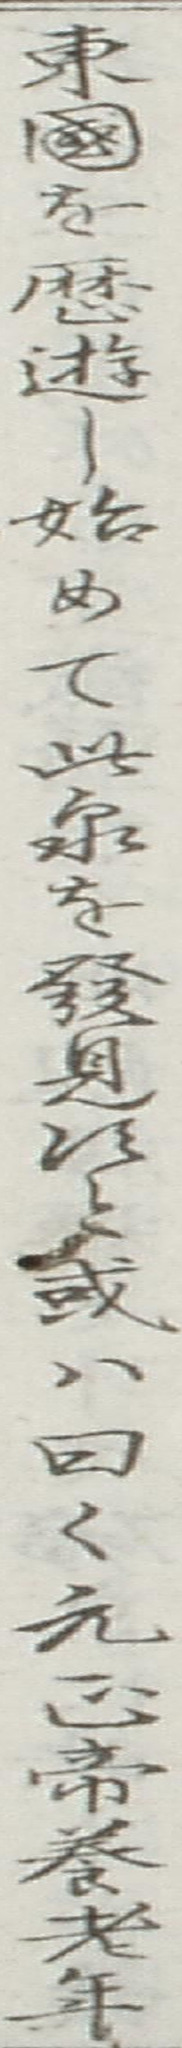東国を歴遊し始めて此泉を発見すと或は曰く元正帝養老年
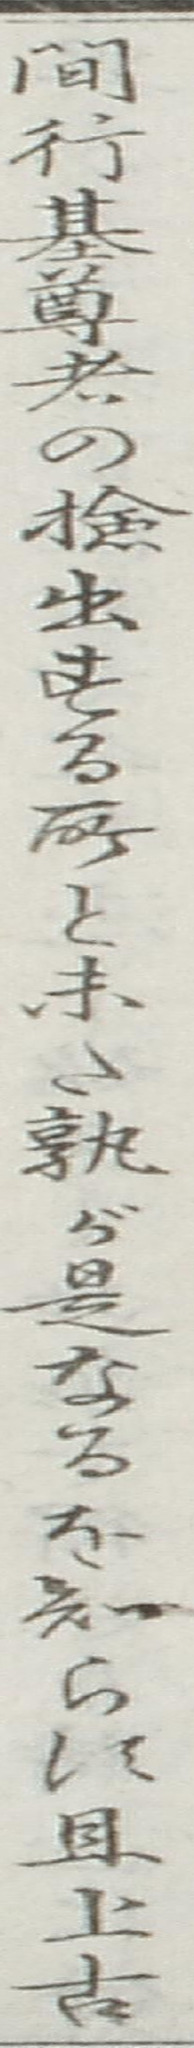間行基尊者の検出する所と未た孰が是なるを知らず且上古
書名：草津温泉誌　全
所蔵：東京大学地震研究所図書室 Earthquake Research Institute Library, The University of Tokyo, JAPAN
